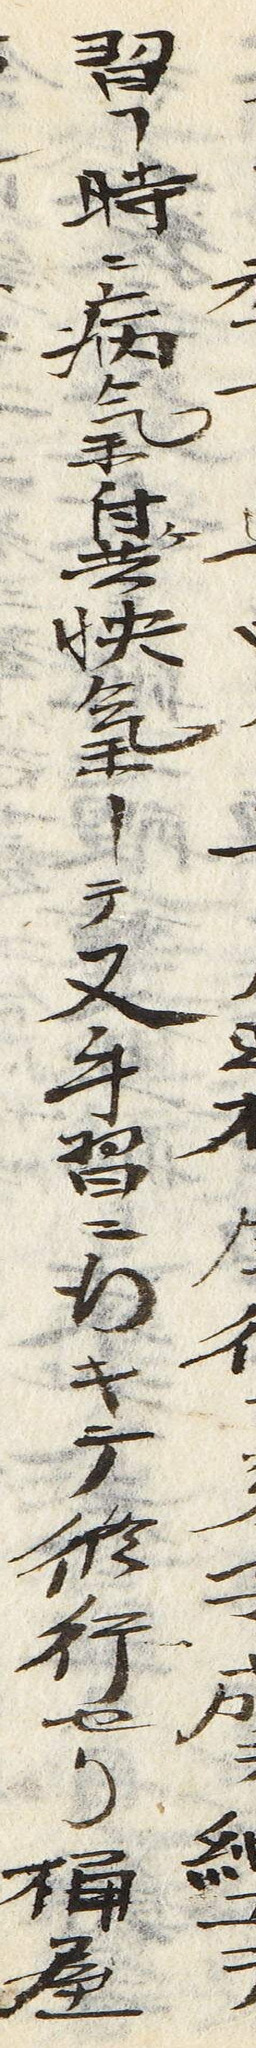習フ時ニ病気付ケ共快気シテ又手習ニ行キテ彼行セリ桶屋
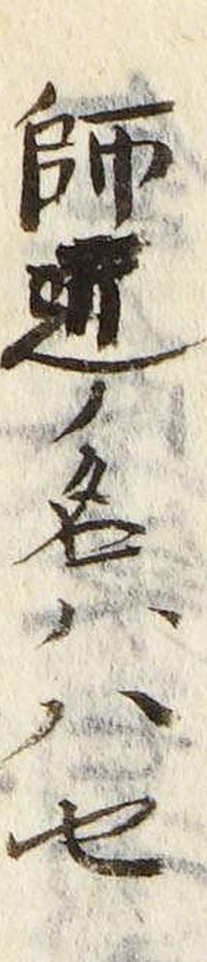師匠ノ名ハハセ
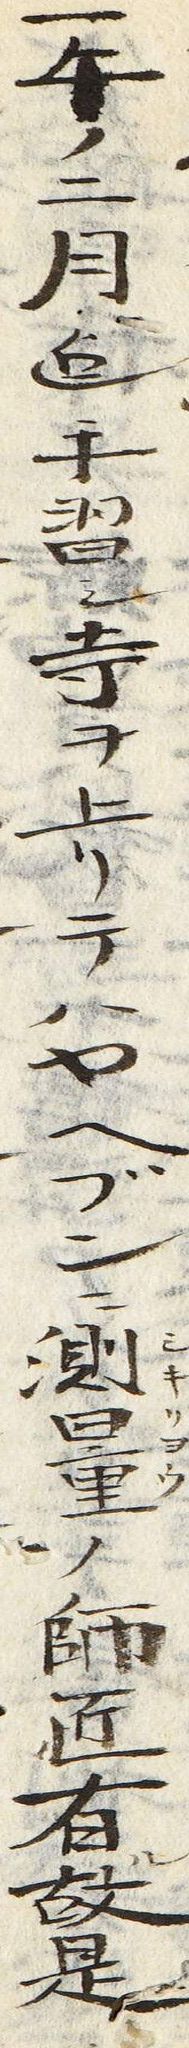一牛ノ二月迄手習シ寺ヲ上リテハヤヘブンニ測量ノ師匠有ル故是
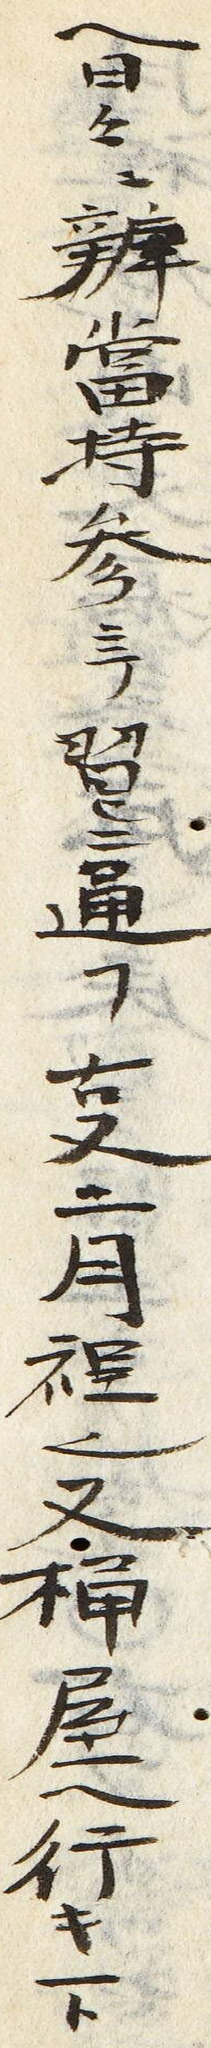ヘ日々ニ弁当持参ニテ習ヒニ通フ事二月程也桶屋ヘ行キ一ト

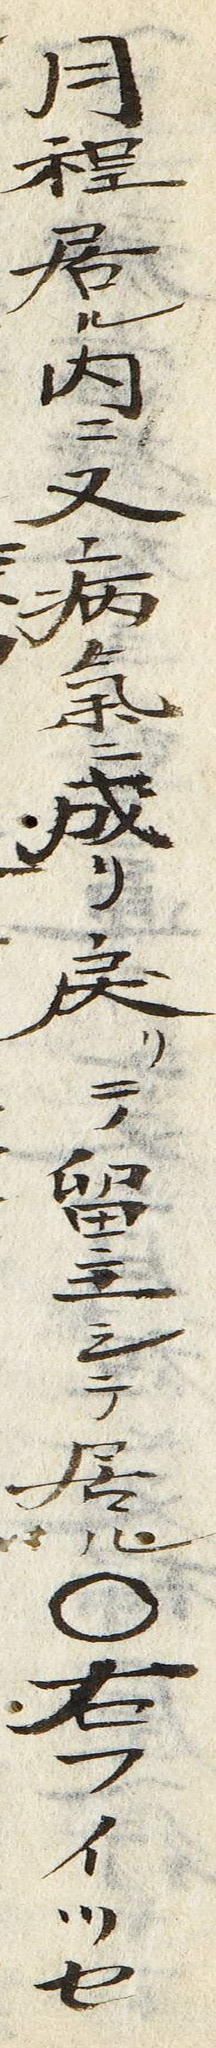月程居ル内ニ又病気ニ成リ戻リテ留主シテ居ル〇フイツセ
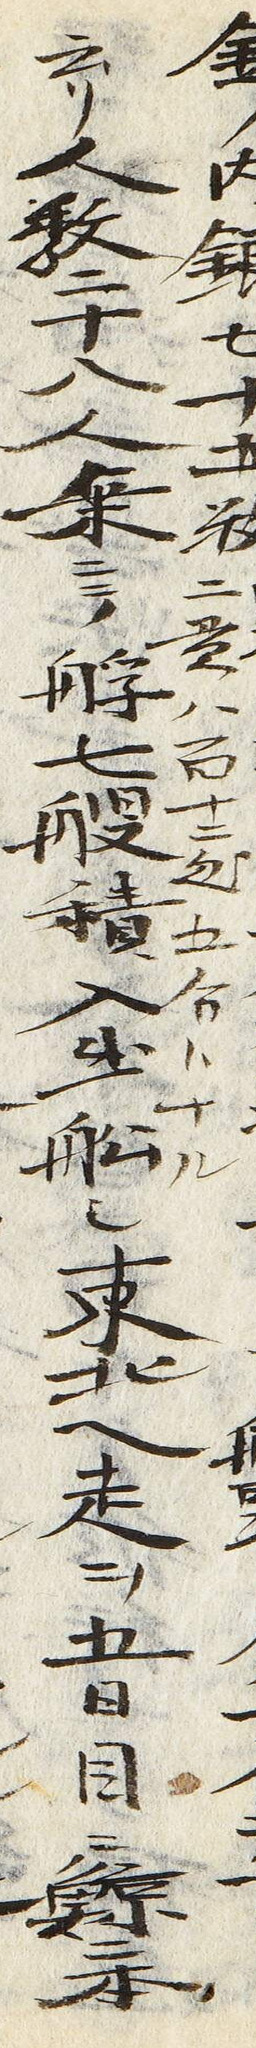云リ人数二十八人乗ニテ艀七艘積入出船シ東北ヘ走ヲ五日目ニ鯨日本
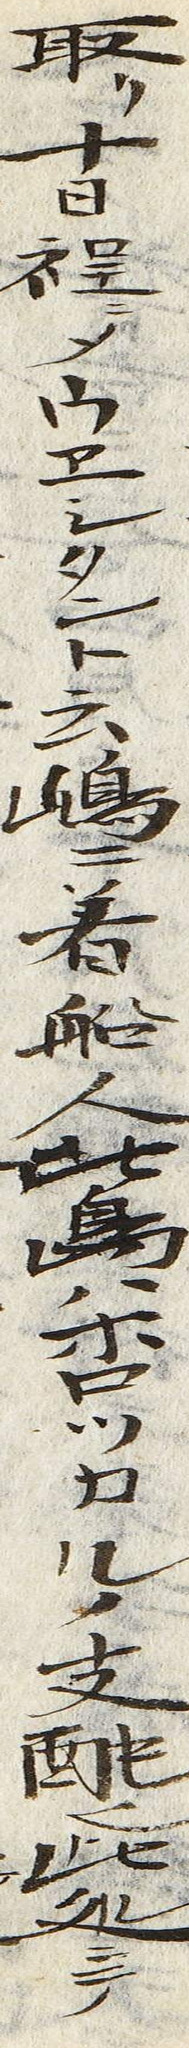取リ十日程ニメウエシタント云嶋ニ着船人此島ハホロツカルノ支配也此処ニテ
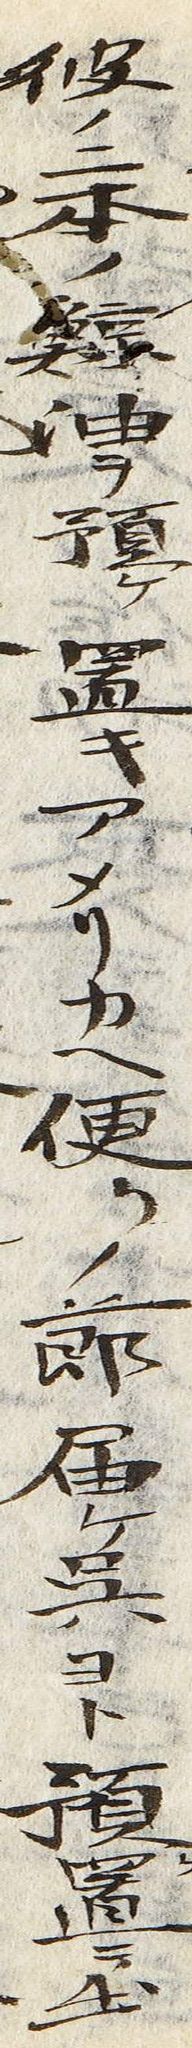彼ノ二本ノ鯨油ヲ預ケ置キアメリカヘ便リノ節届ケ呉ヨト預ケ置テ出
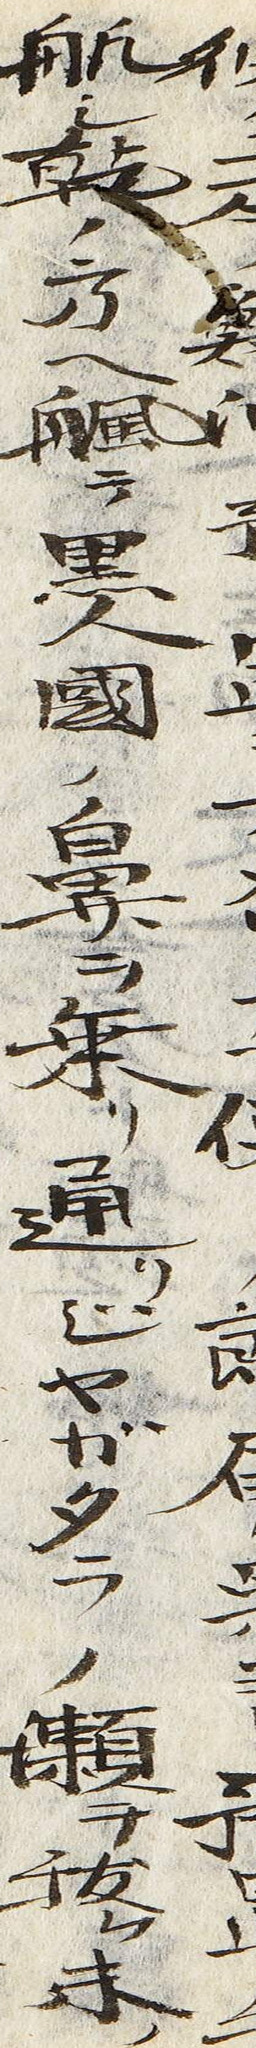航シ乾ノ方ヘ帆テ黒人国ノ鼻ヲ乗リ通リジヤガタラノ瀬ヲ抜ケ未ノ
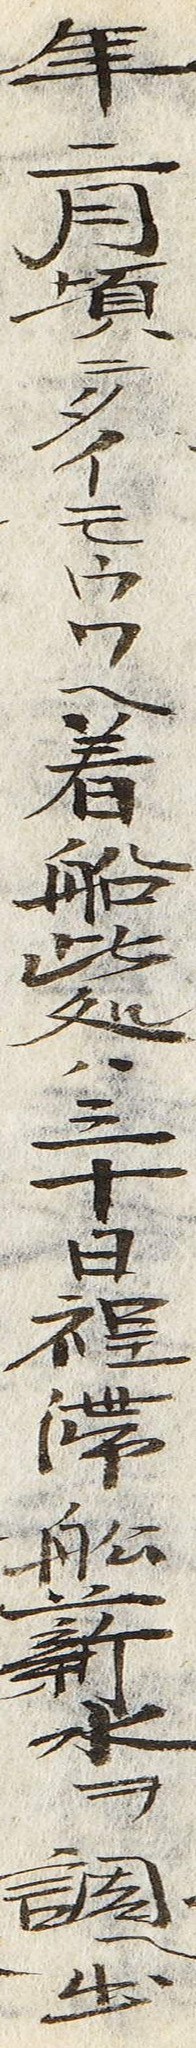年二月頃ニタイモウワヘ着船此処ハ三十日程滞船薪水ヲ調ヘ出
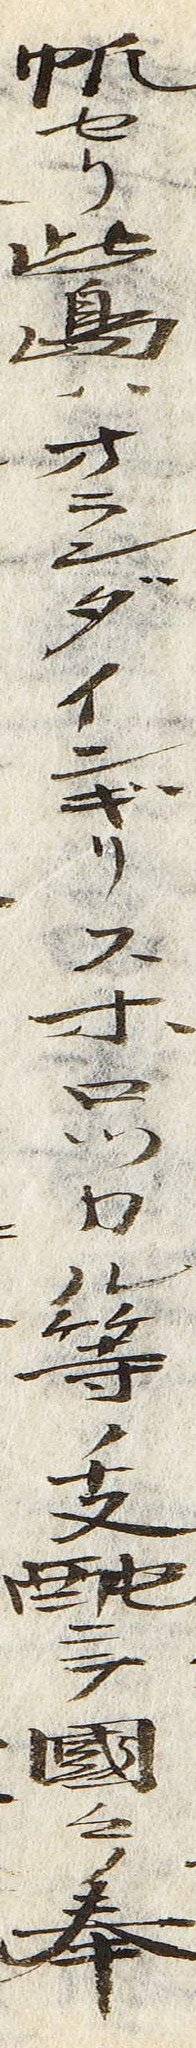航セリ此島ハオランダインギリスホロツカル等ノ支配ニテ国々ノ奉
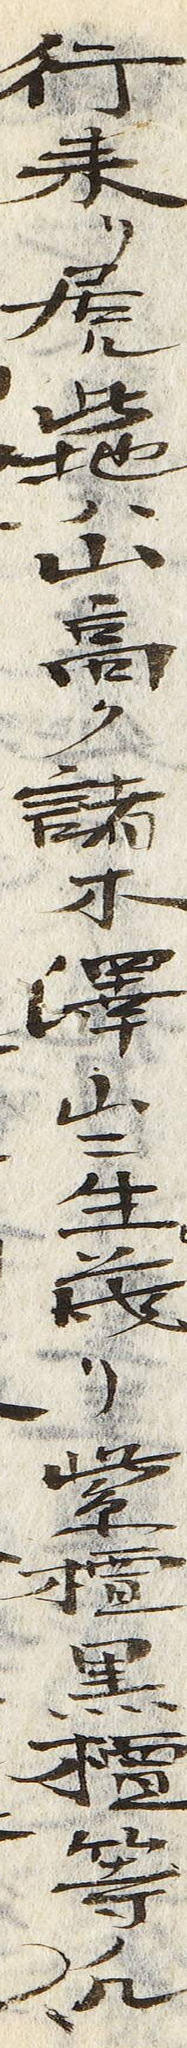行来リ居ル此地ハ山高ク諸木沢山ニ生ヒ茂リ紫檀黒檀等ノハ
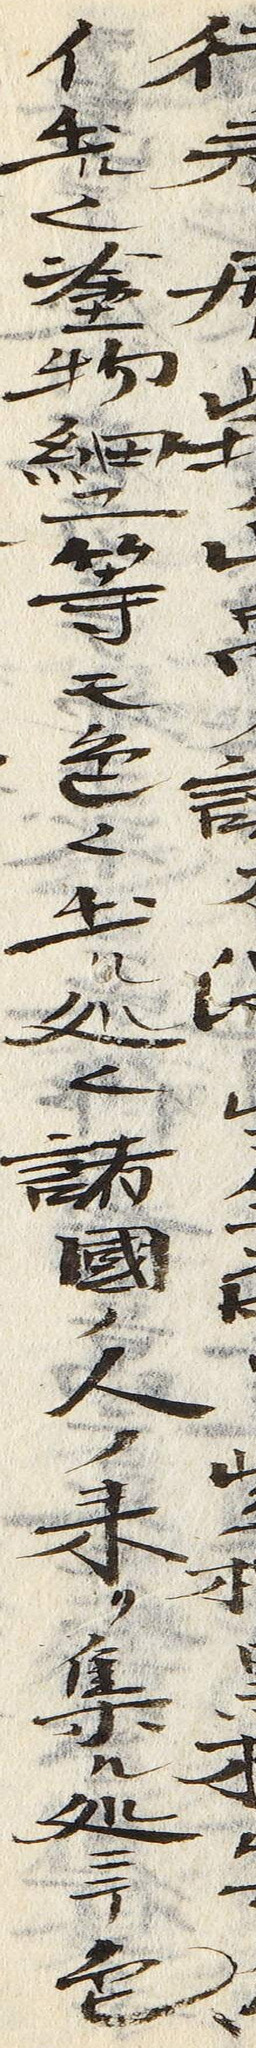イ出ル也塗物細工等モ色々出ル処也諸国ノ人ノ来リ集ル処ニテ色
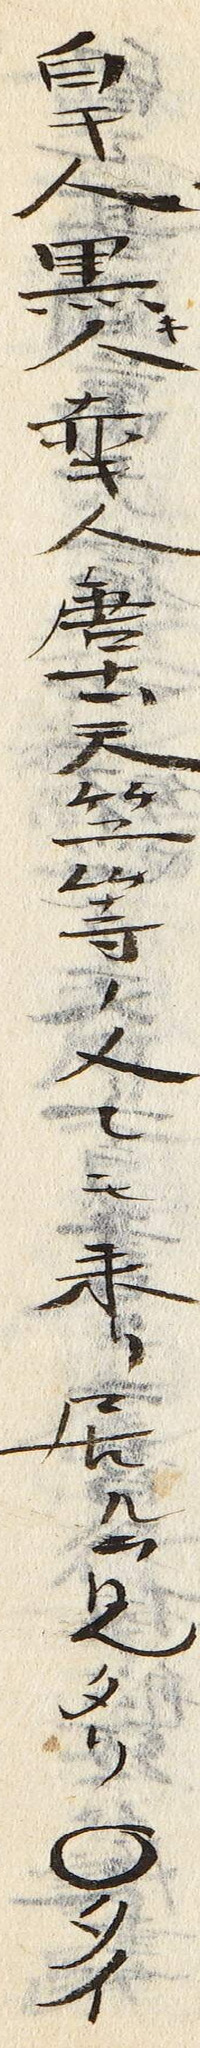白キ人黒キ人赤キ人唐土天竺等ノ人々モ来リ居ルヲ見タリ〇タイ
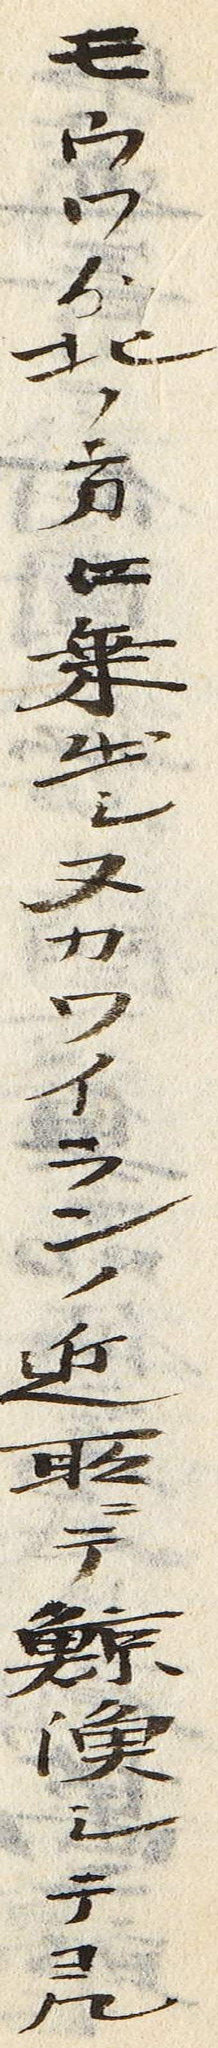モウツゟ北ノ方え乗出シ又カワイランノ近所ニテ鯨漁シテヨル
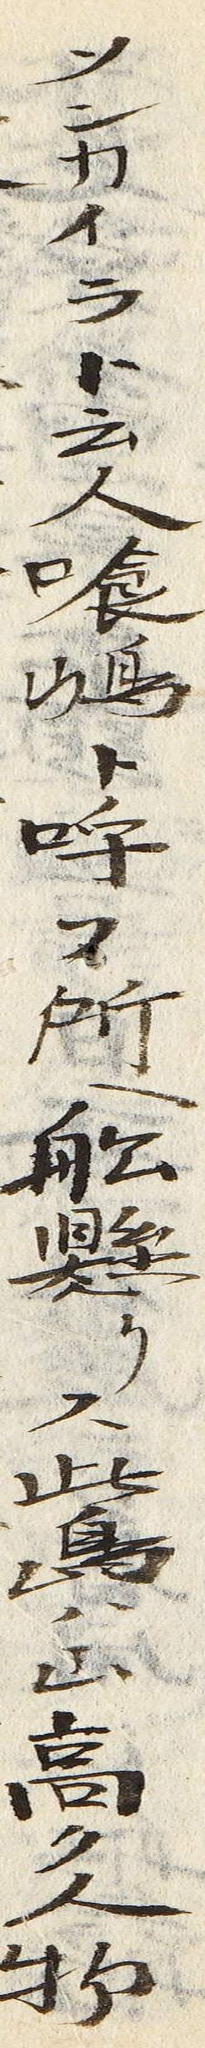メンカイラト云人喰嶋ト呼フ所へ船掛リス此島ハ山高ク人物
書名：漂流記聞
